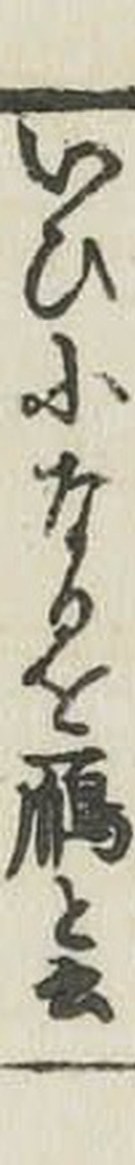いひ小なるを鴈と云
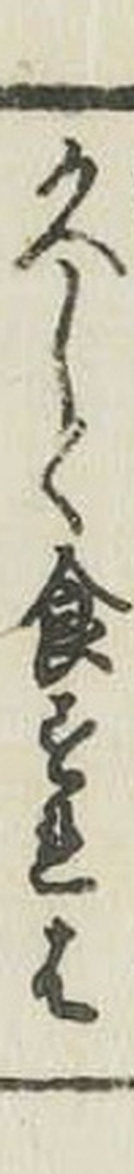久しく食すれは
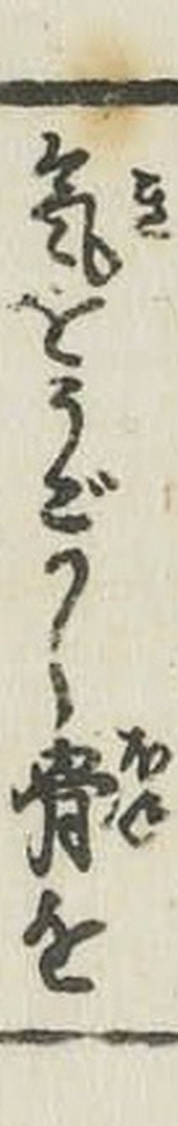気をうごかし骨を
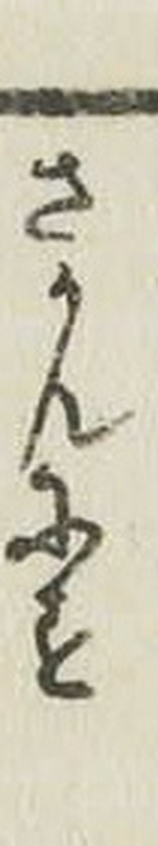さかんにす
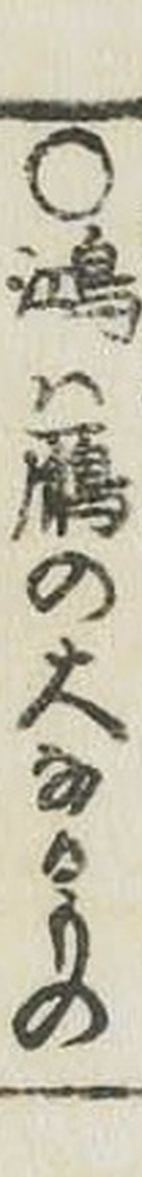○鴻は鴈の大なるもの
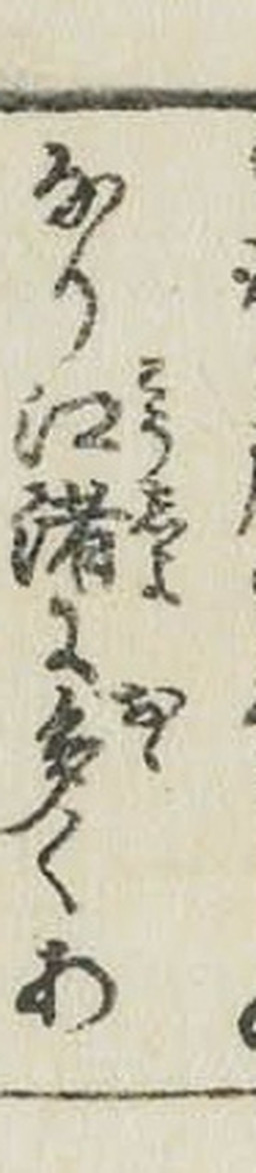なり江渚に多くあ
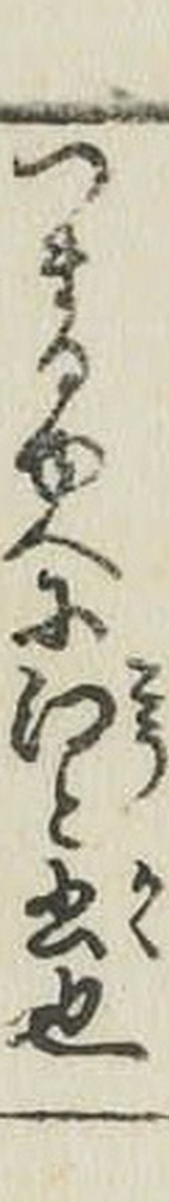つまるゆへに江と書也
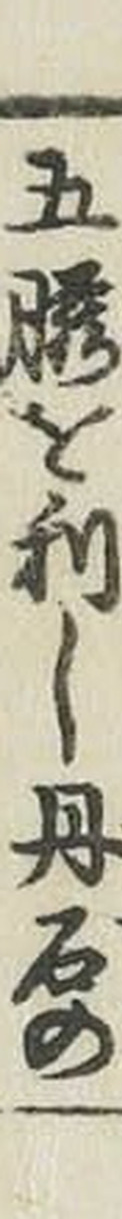五臓を利し丹石の
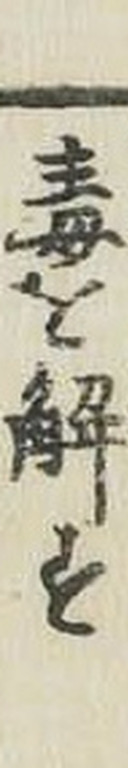毒を解す
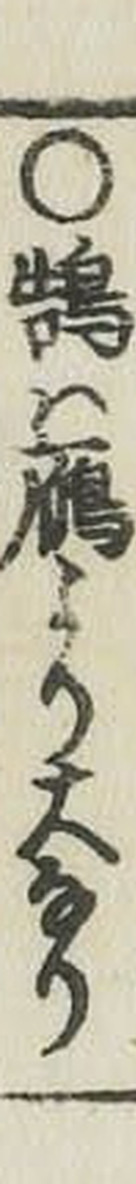○鵠は鴈より大なり
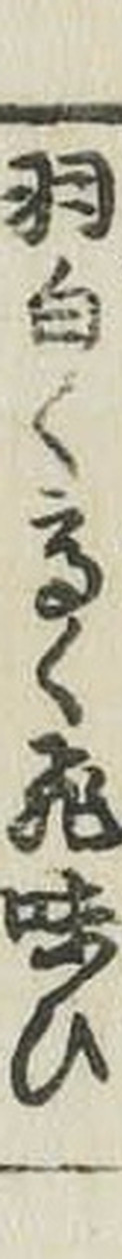羽白く高く飛味ひ
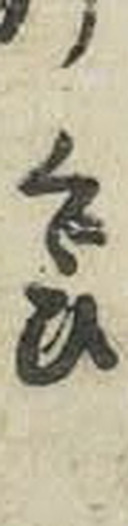くゞひ
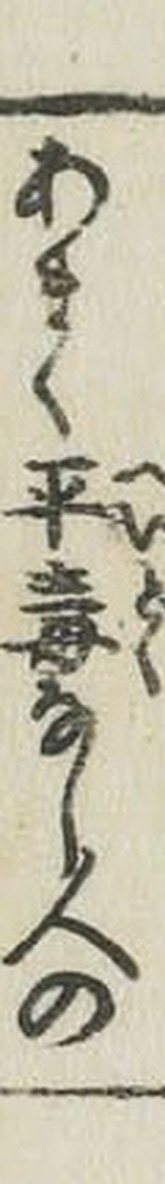あまく平毒なし人の
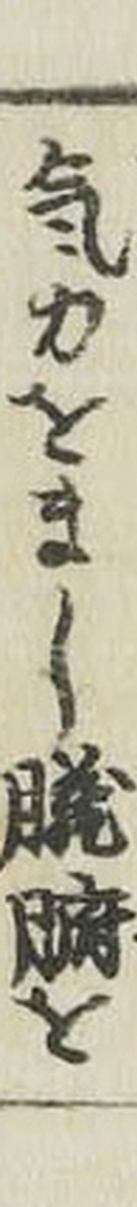気力をまし臓腑を

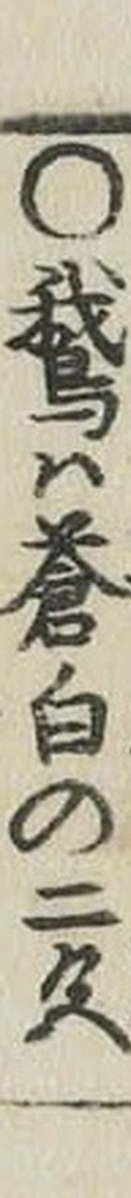○鵞は蒼白の二色
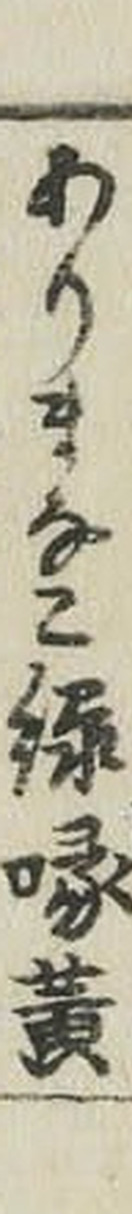ありまなこ緑喙黄
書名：増補頭書訓蒙図彙大成 10巻 6:巻之12-13
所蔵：東京学芸大学教育コンテンツアーカイブ
